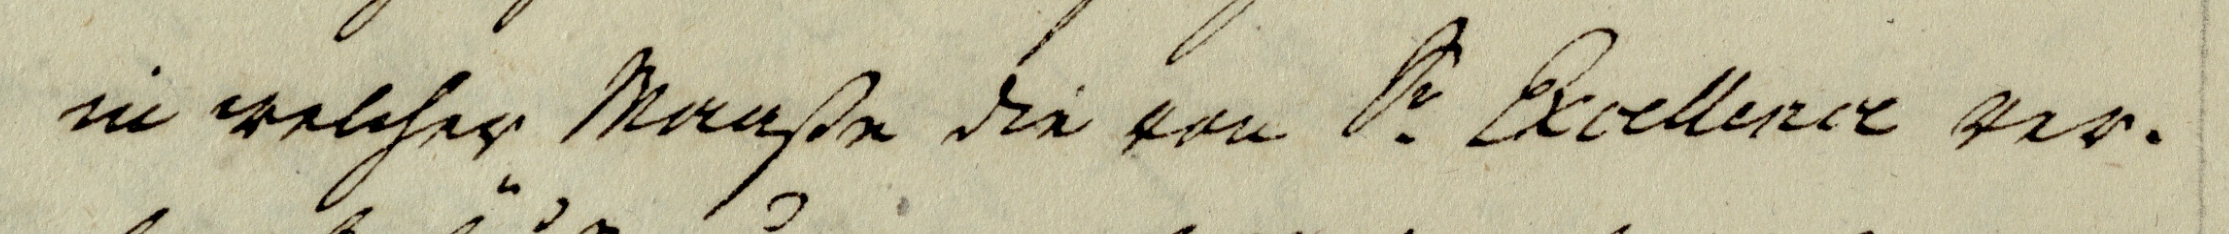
in welcher Maaße die von Sr Excellence ver¬
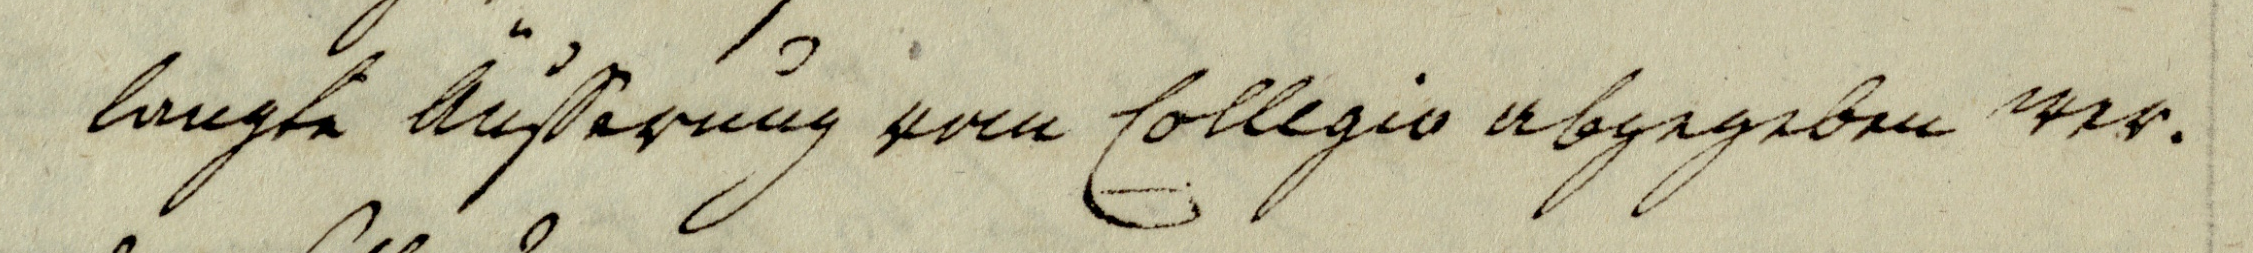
langte Äusserung vom Collegio abgegeben wer¬
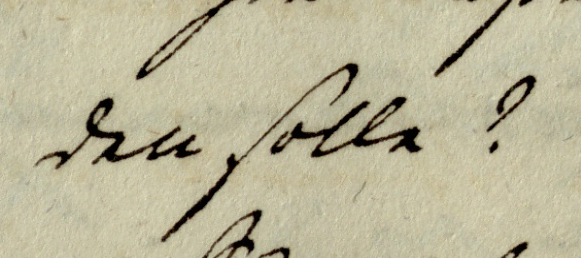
den solle?
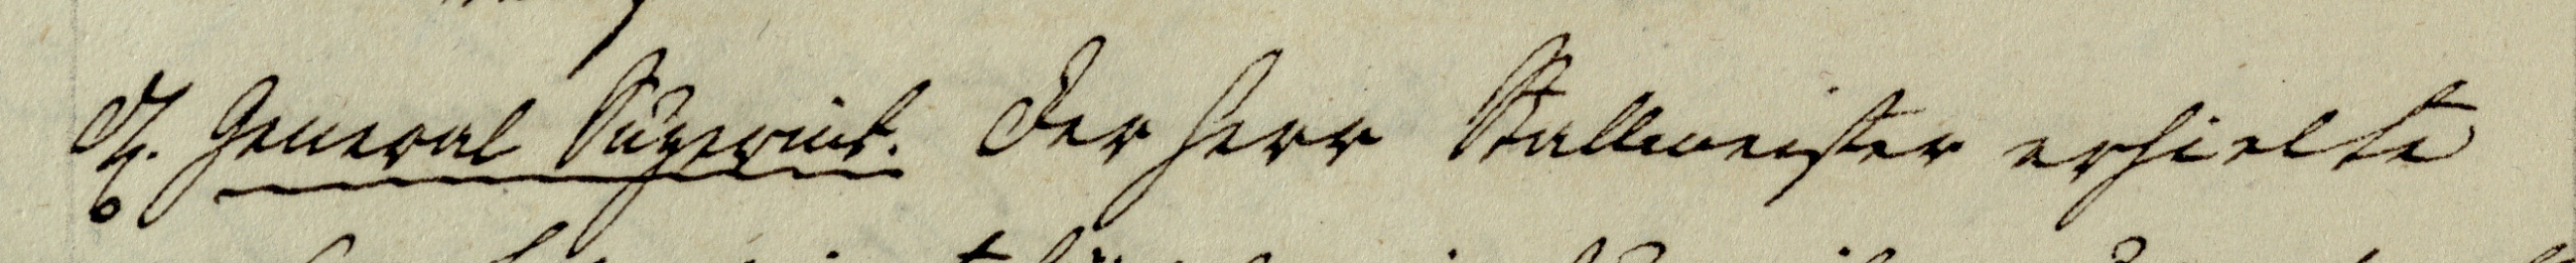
dh. General Superint. Der Herr Stalleneiter erhielte
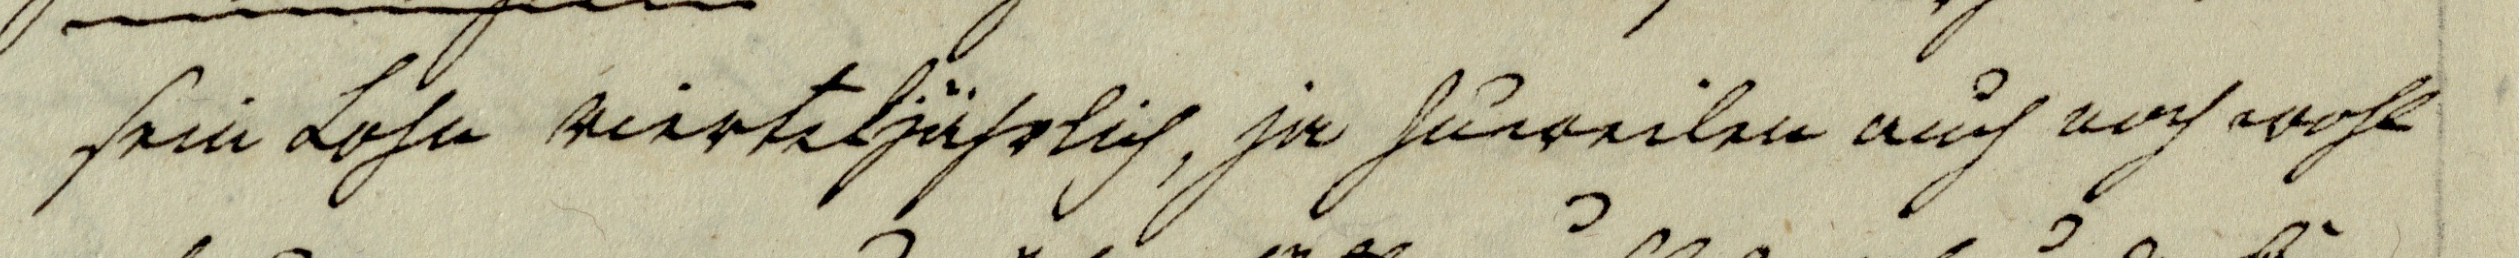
sein Lohn vierteljährlich, je zuweilen auch noch wohl
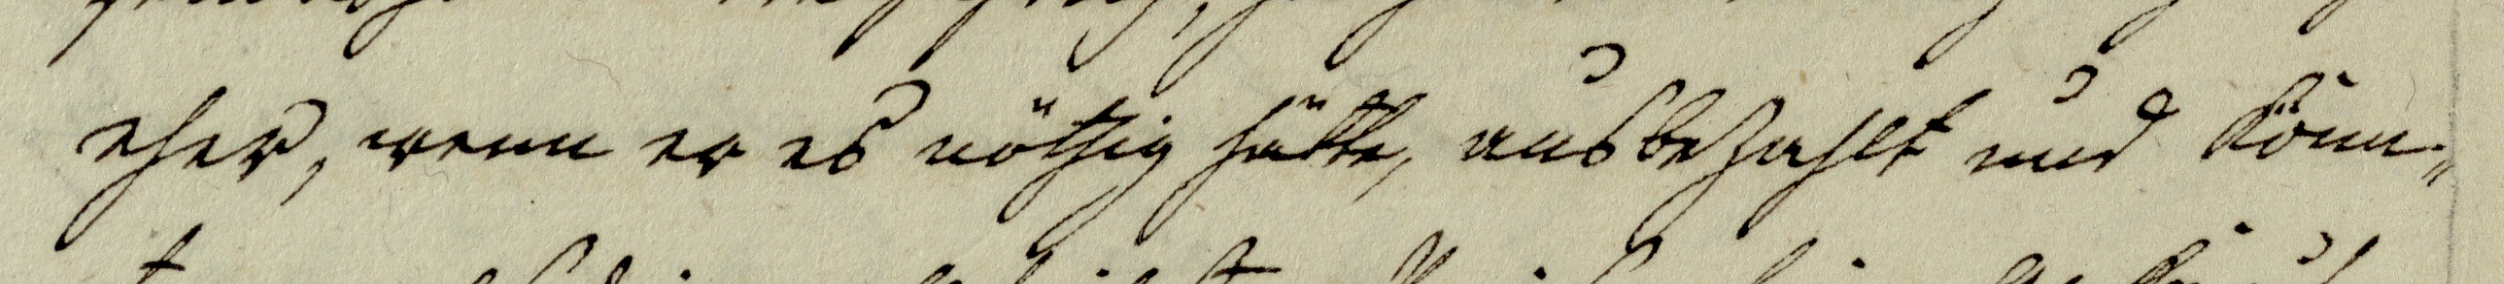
eher, wenn er es nöthig hätte, ausbezahlt und könn¬
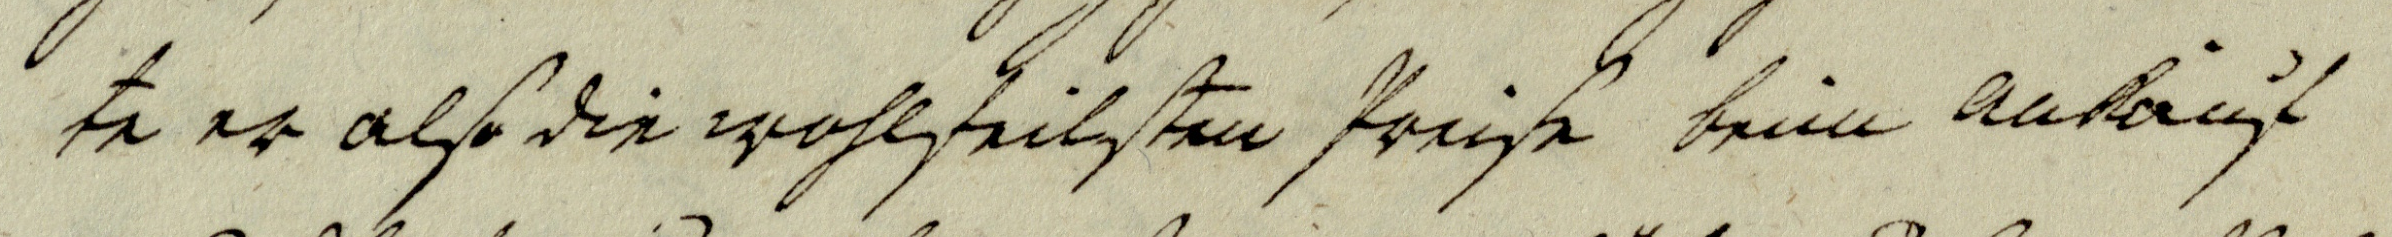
te er also die wohlfeilsten Preise beim Ankauf
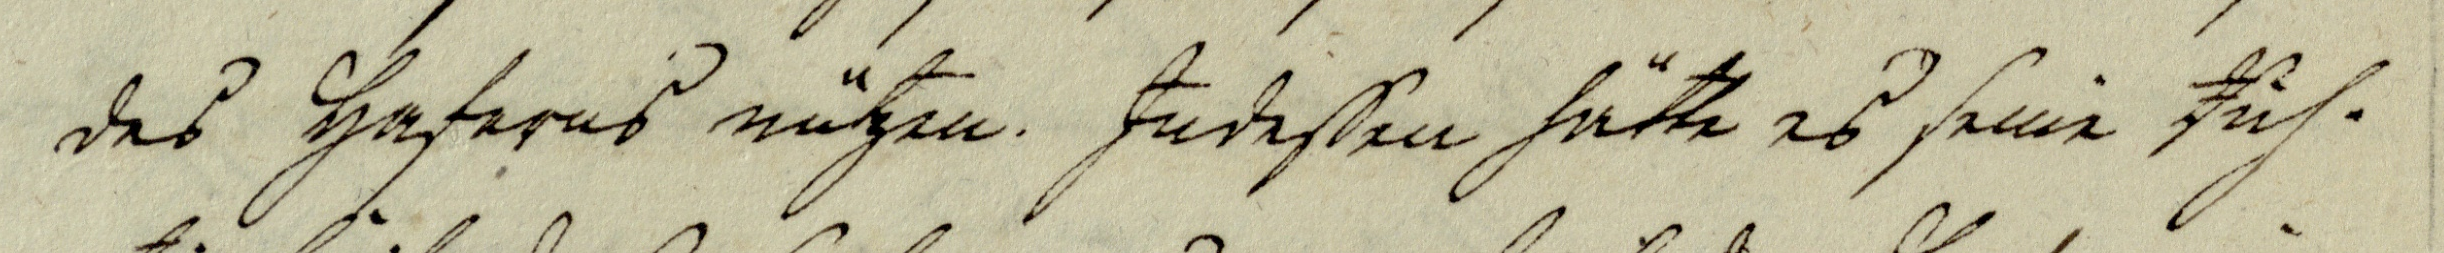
des Haferns nützen. Indessen hätte es seine Rich¬
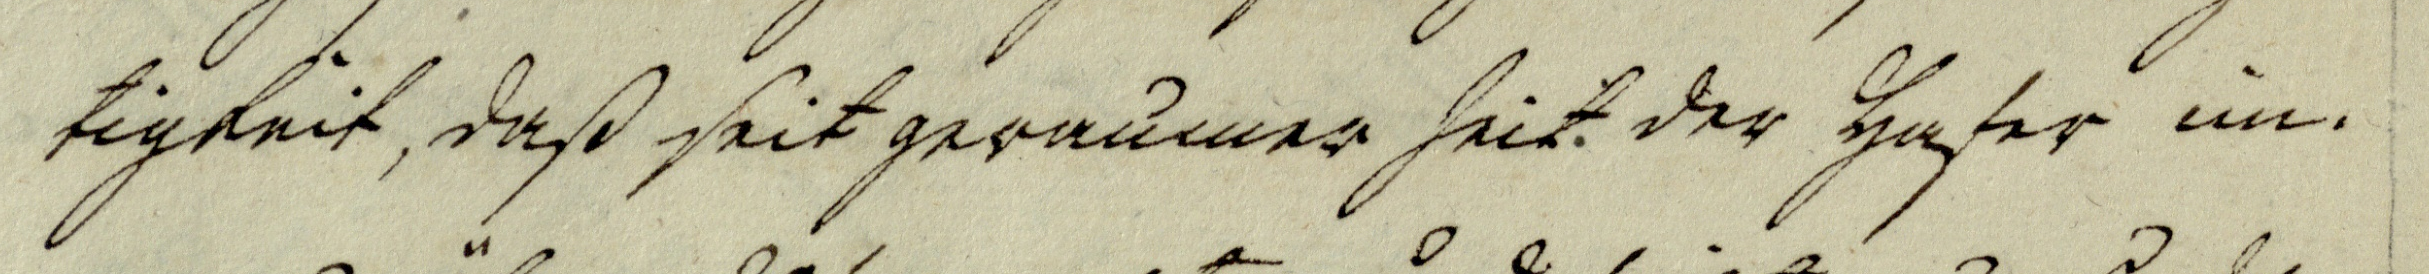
tigkeit, daß seit geraumer Zeit der Hafer im¬
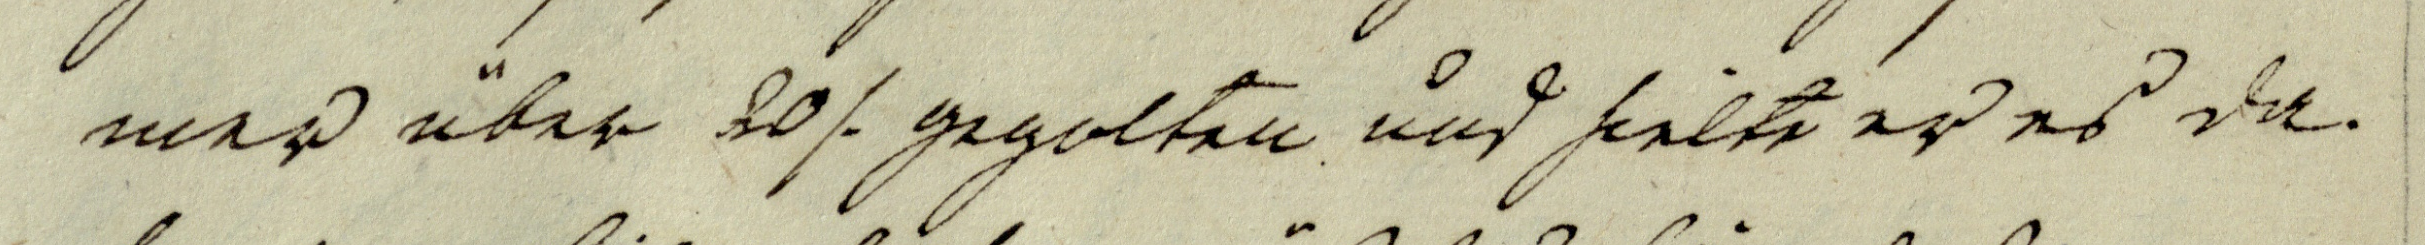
mer über 20 s. gegolten und hielte er es da¬
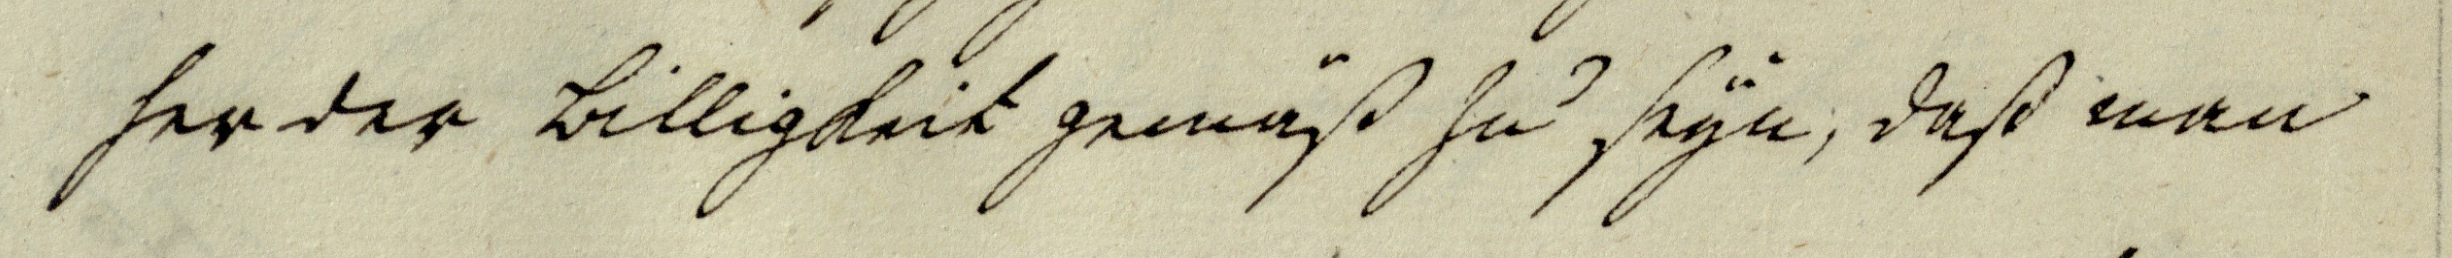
her der Billigkeit gemäß zu seÿn, daß man
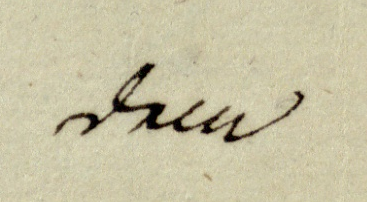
dem
